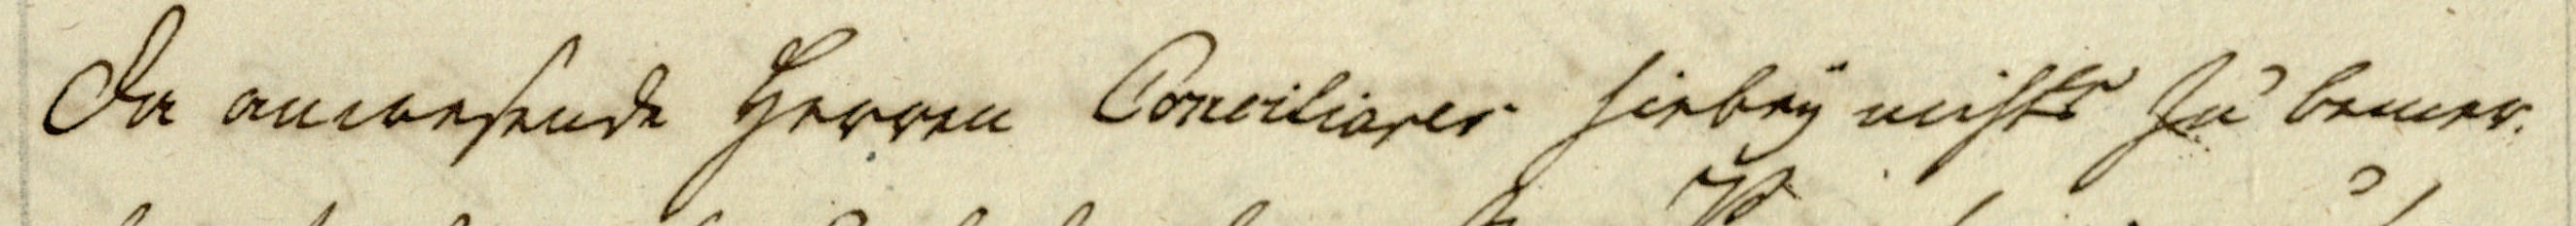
Da anwesende Herren Conciliares hiebeÿ nichts zu bemer¬
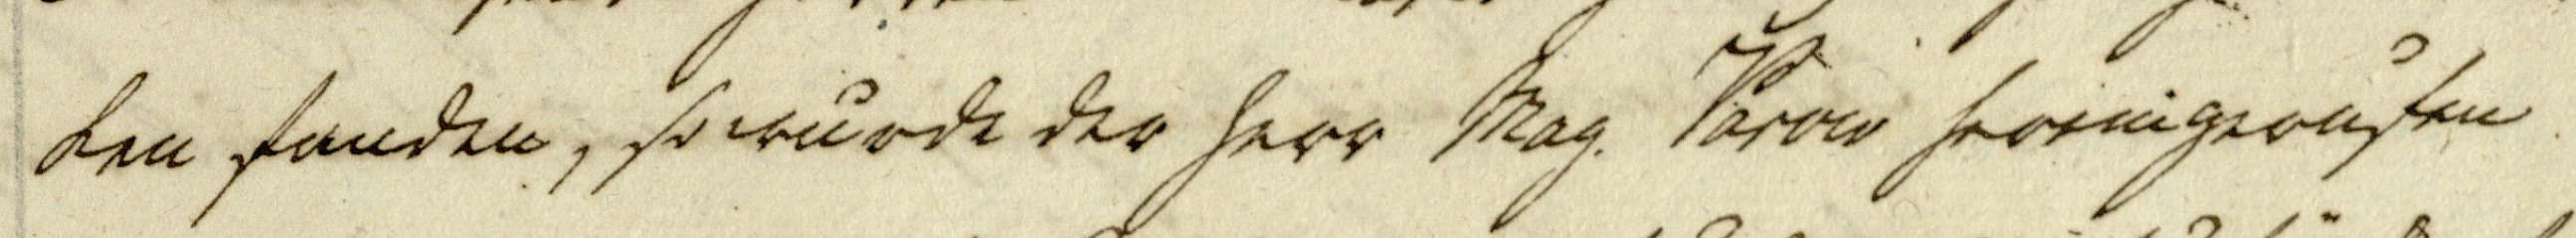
ken fanden, so wurde der herr Mag. Parow hereingerufen
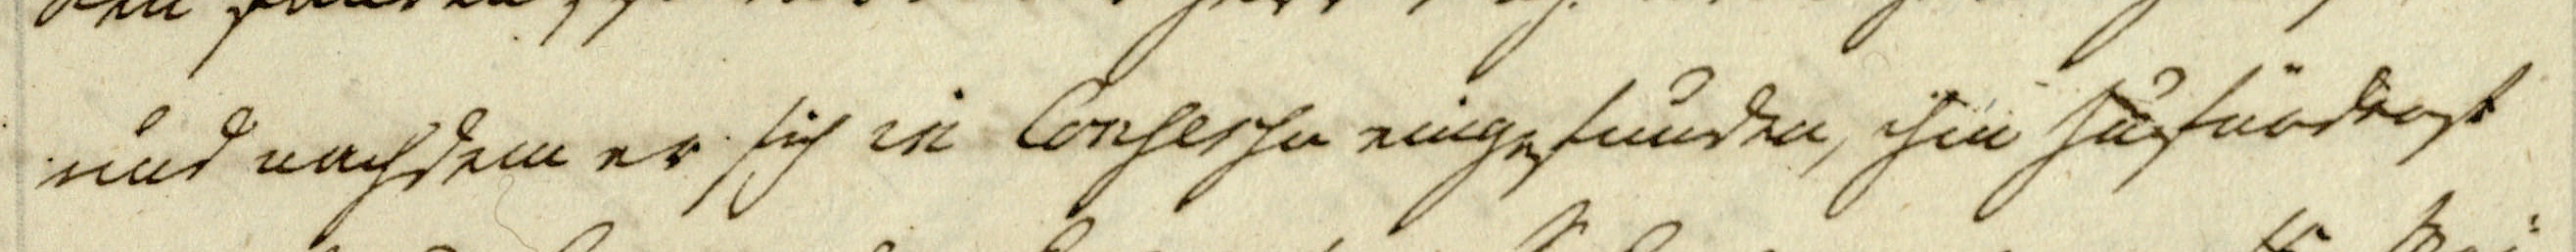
und nachdem er sich in Consessu eingefunden, ihm zuförderst
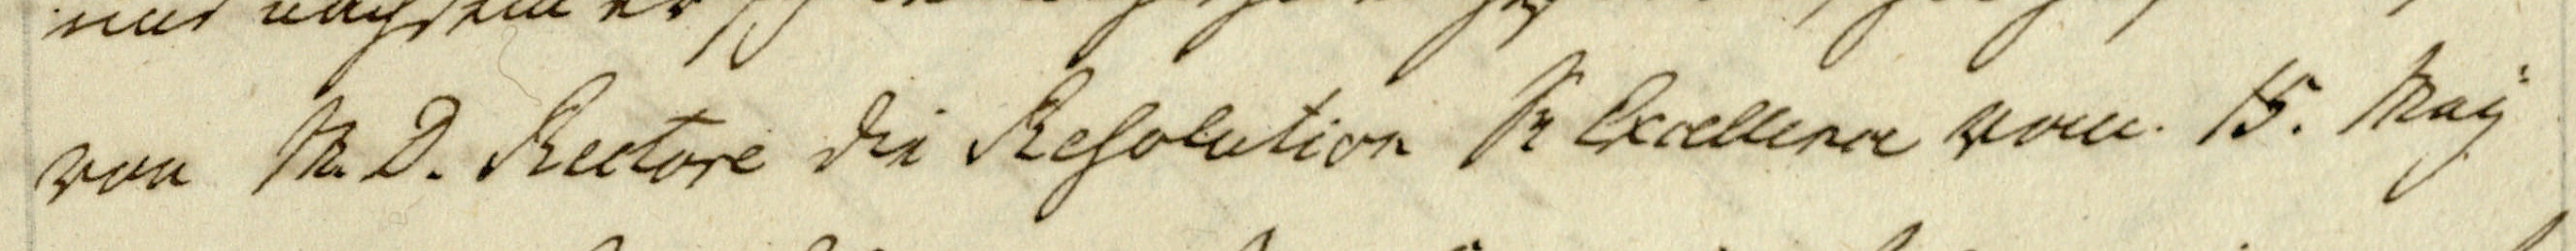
von M. D. Rectore die Resolution Sr. Excellence vom 15. Maÿ
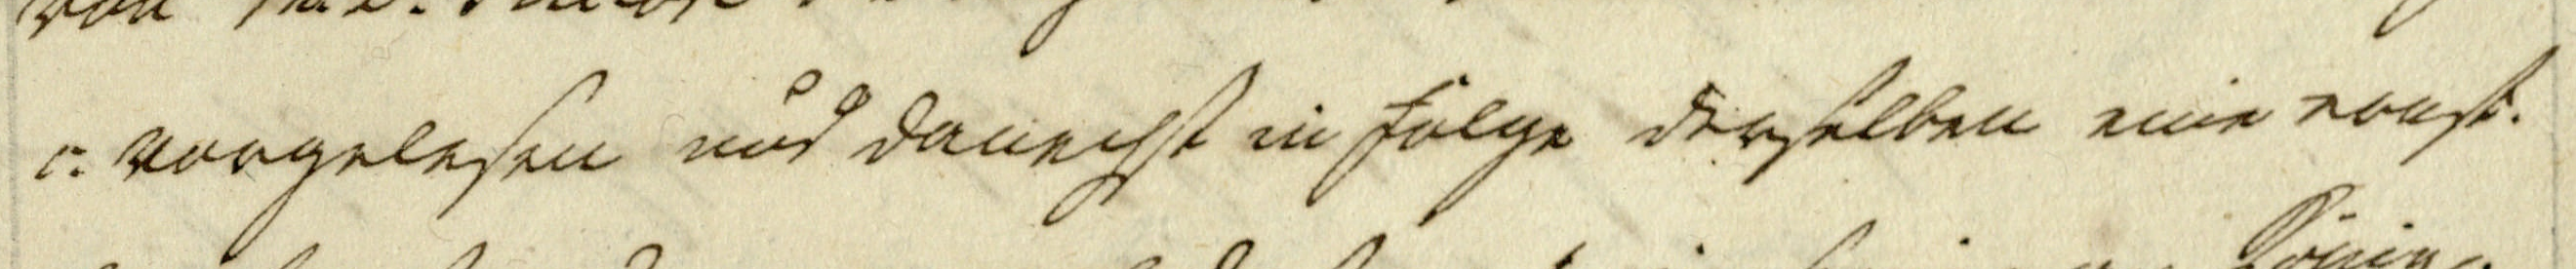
c. vorgelesen und danechst in Folge derselben eine ernst¬
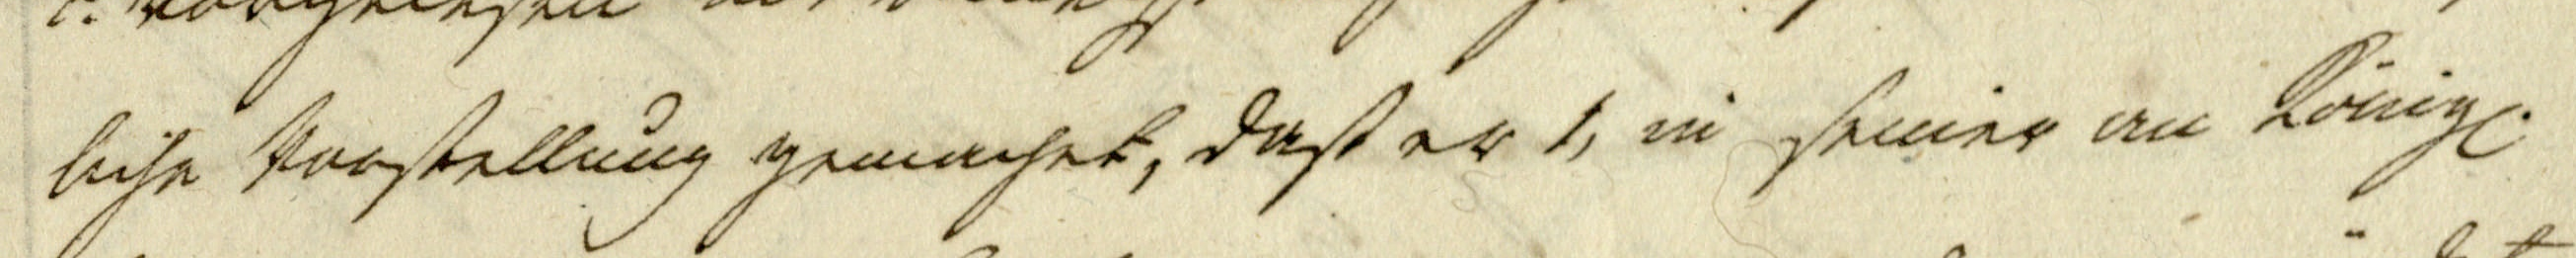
liche Vorstellung gemachet, daß er 1, in seiner an Königl.
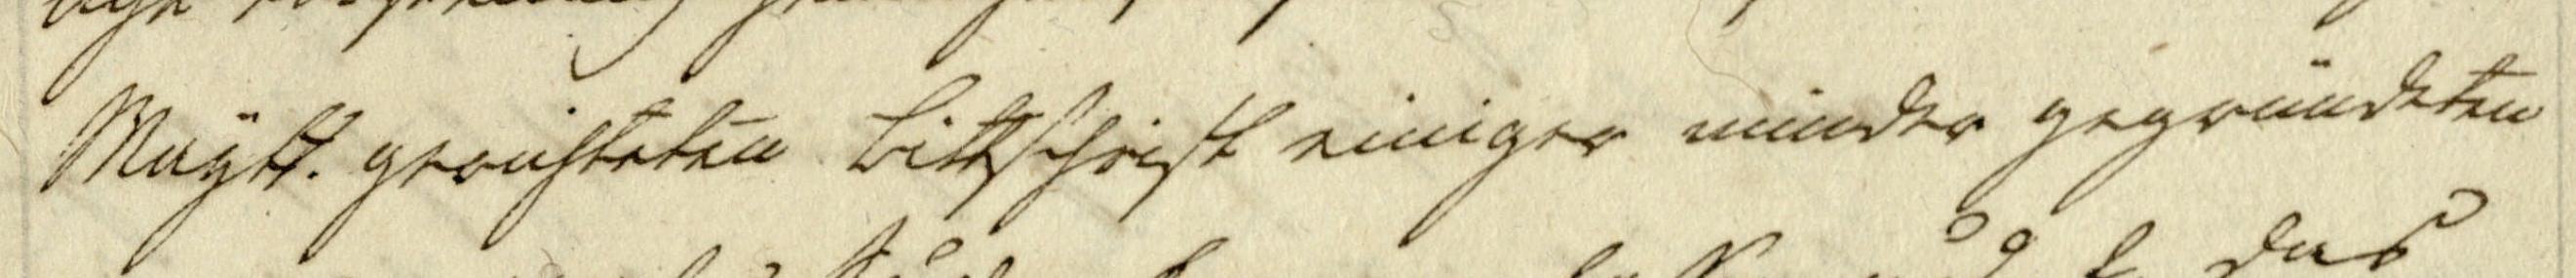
Maÿtt. gerichteten Bittschrift einiger minder gegründeten
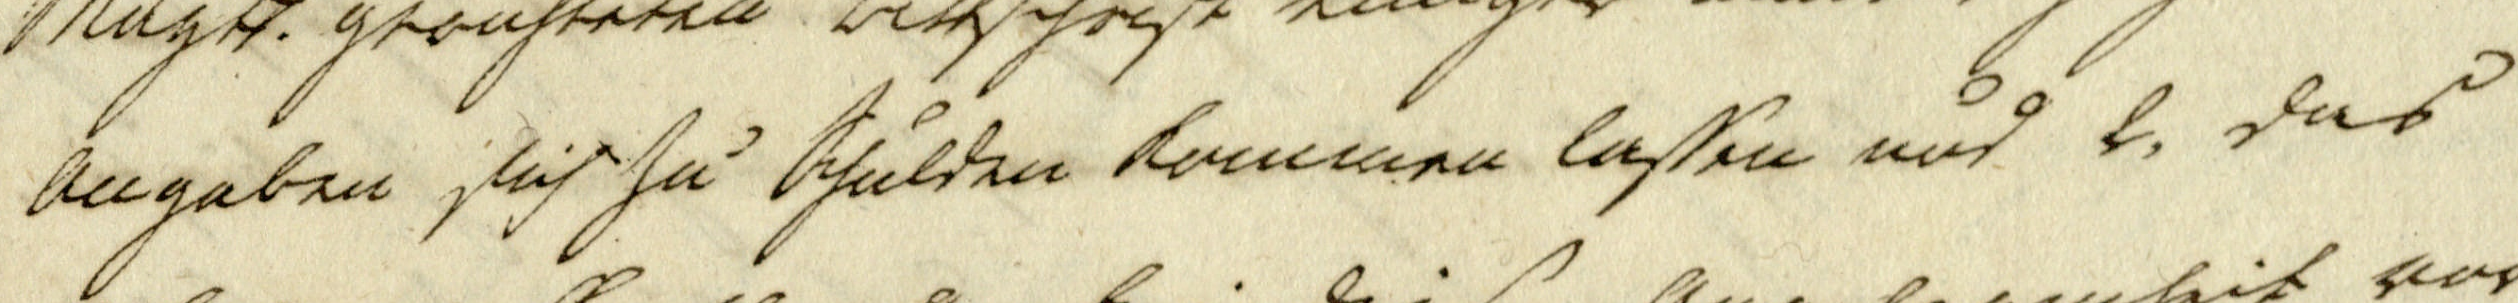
Angaben sich zu Schulden kommen lassen und 2, das
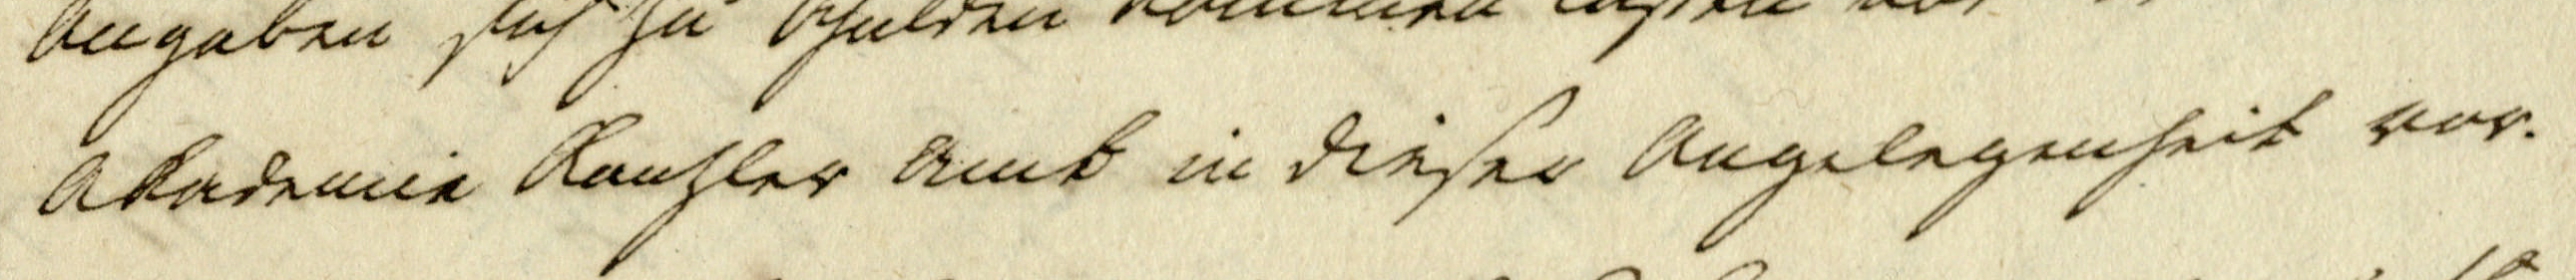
Akademie Kanzler Amt in dieser Angelegenheit vor¬
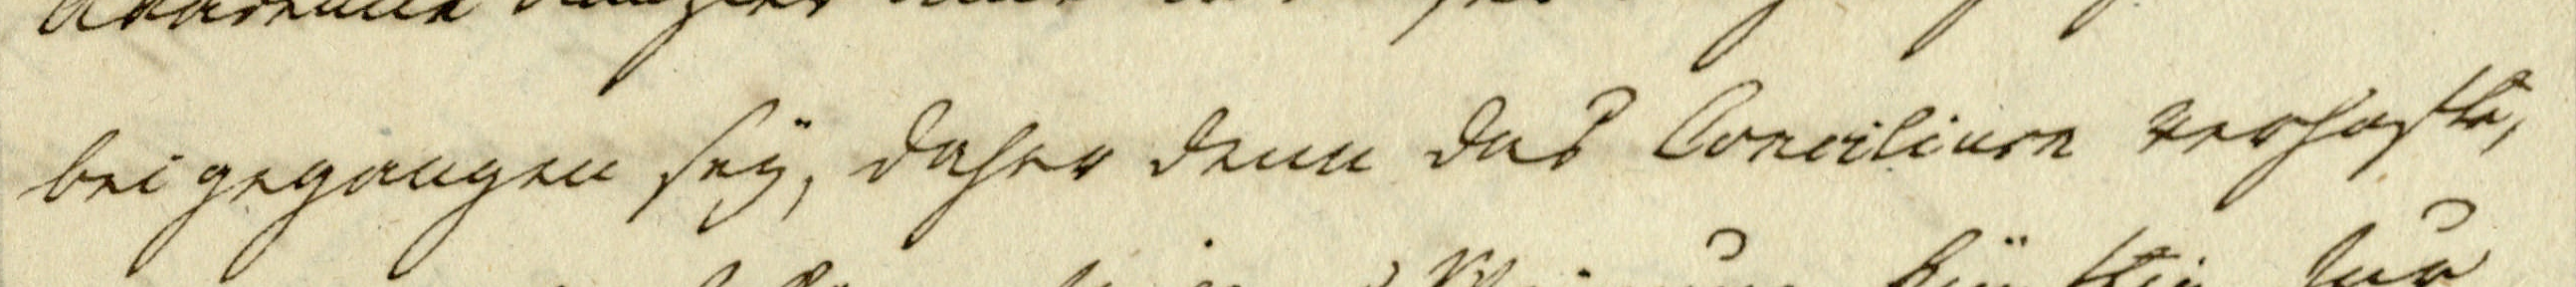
bei gegangen seÿ, daher das Concilium verhofte,
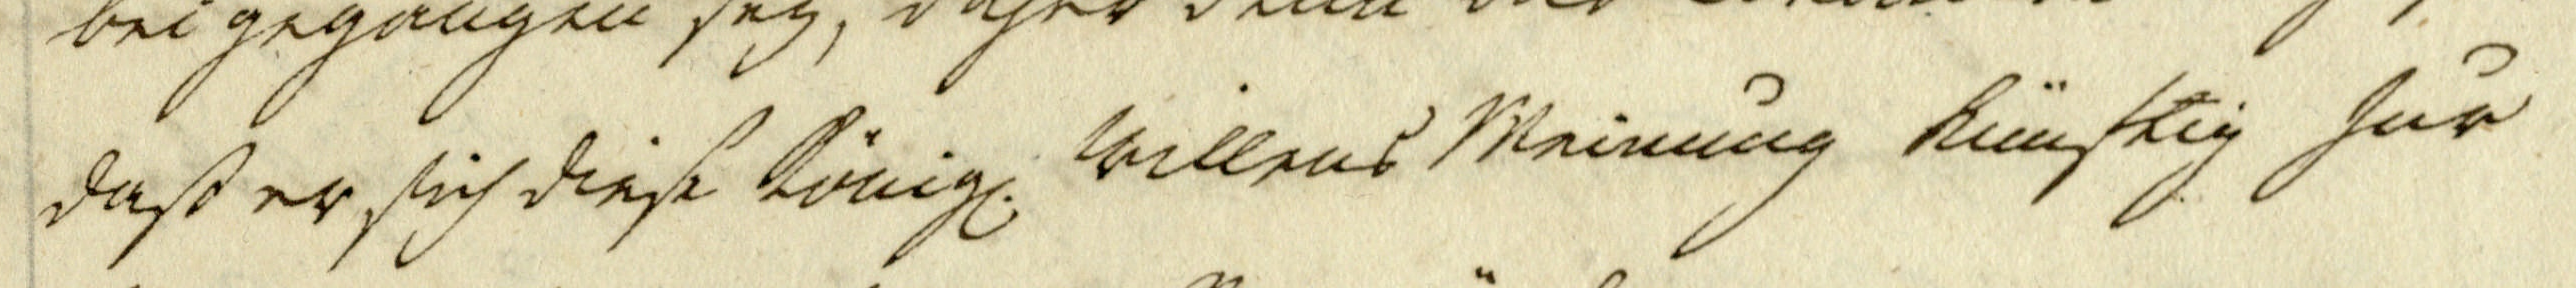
daß er sich diese Königl. Willens Meinung künftig zur
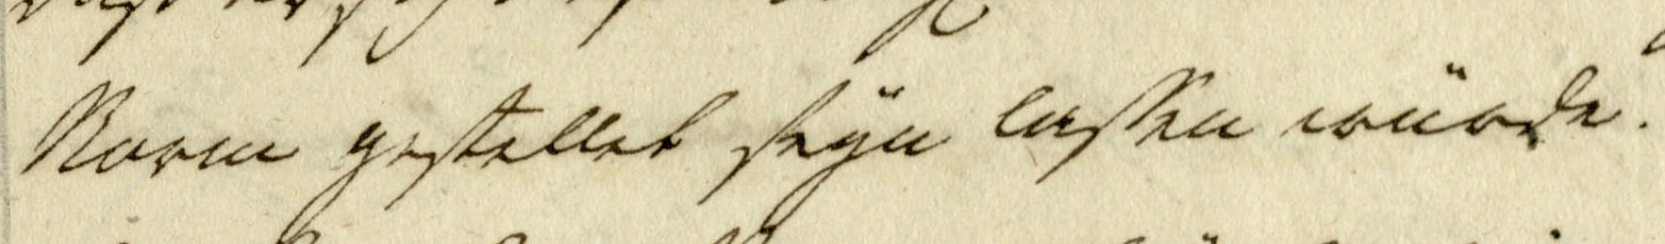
Norm gestellet seÿn lassen würde.
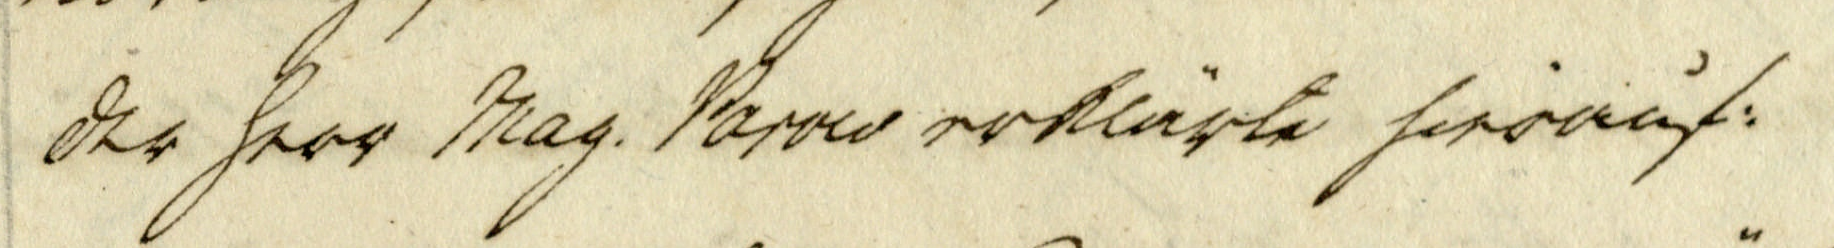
Der herr Mag. Parow erklärte hierauf:
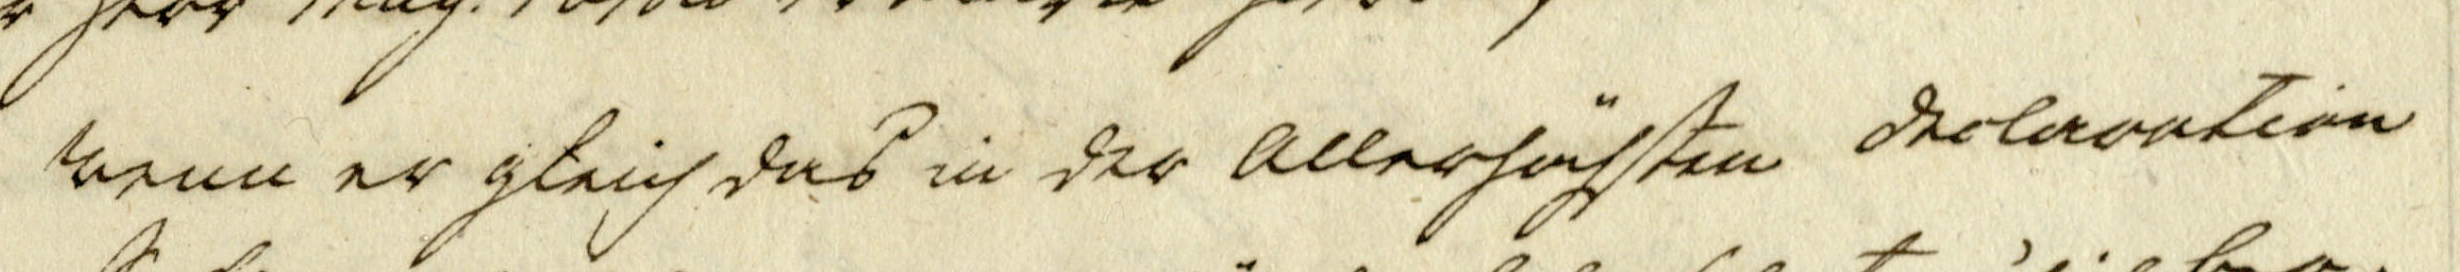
Wenn er gleich das in der Allerhöchsten declaration
